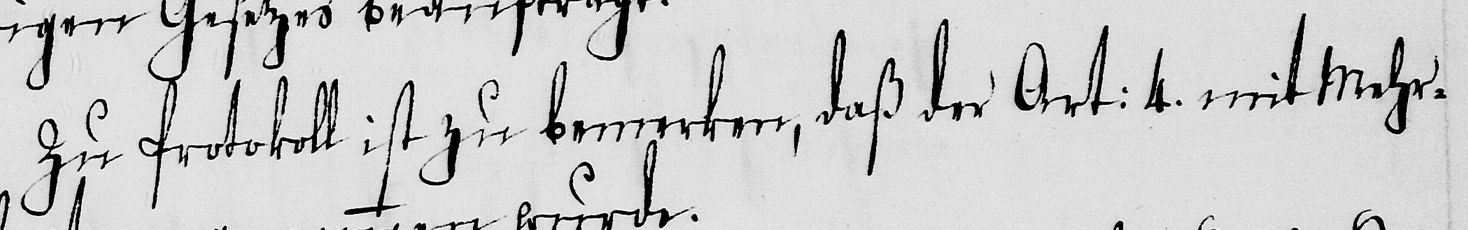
Zu Protokoll ist zu bemerken, daß der Art: 4. mit Mehr¬
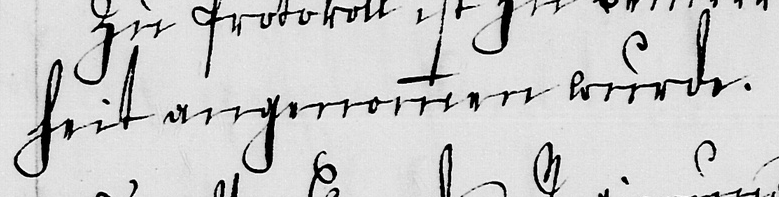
heit angenommen wurde.
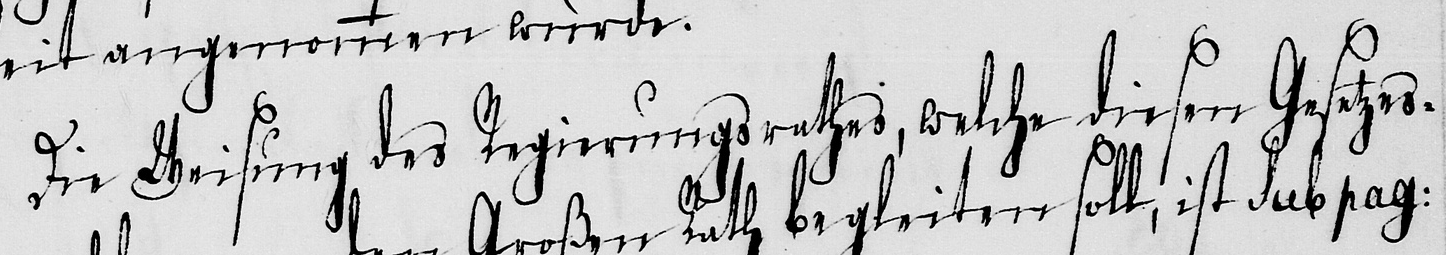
Die Weisung des Regierungsrathes, welche diesen Gesetze¬
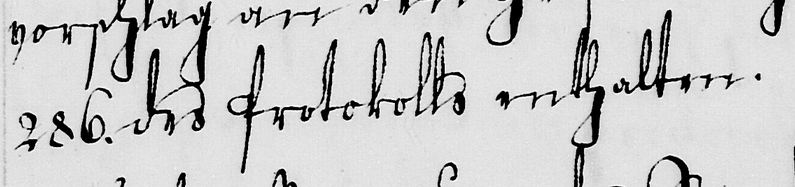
286. des Protokolls enthalten.
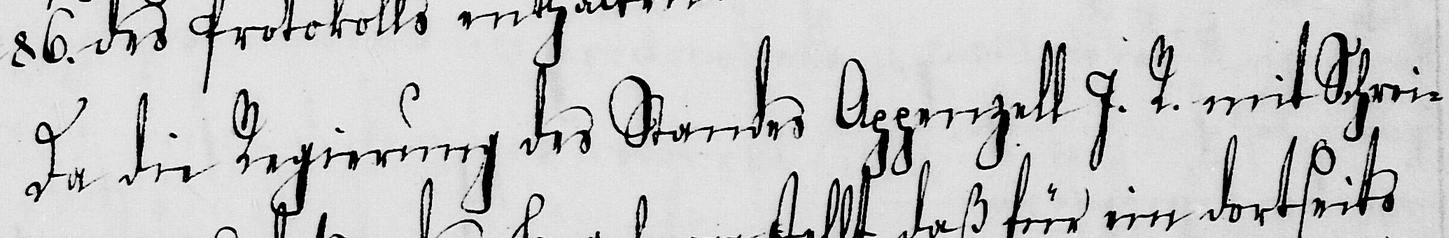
Da die Regierung des Standes Appenzell I. R. mit Schre¬
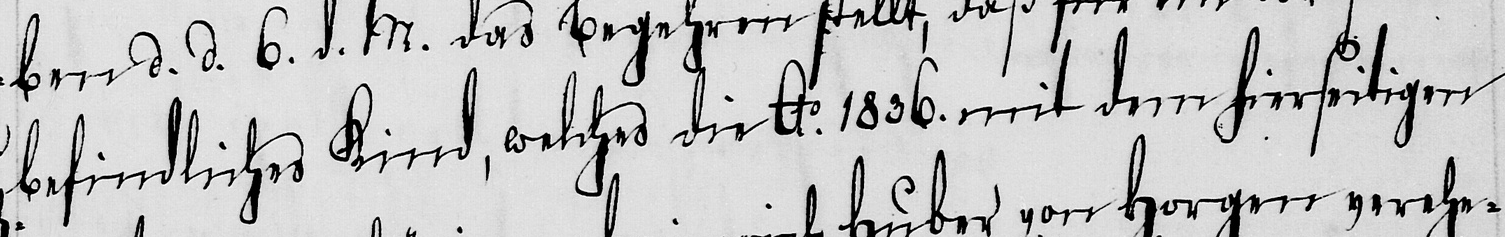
befindliches Kind, welches die Ao. 1836. mit dem hierseitigen
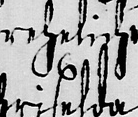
dortseits
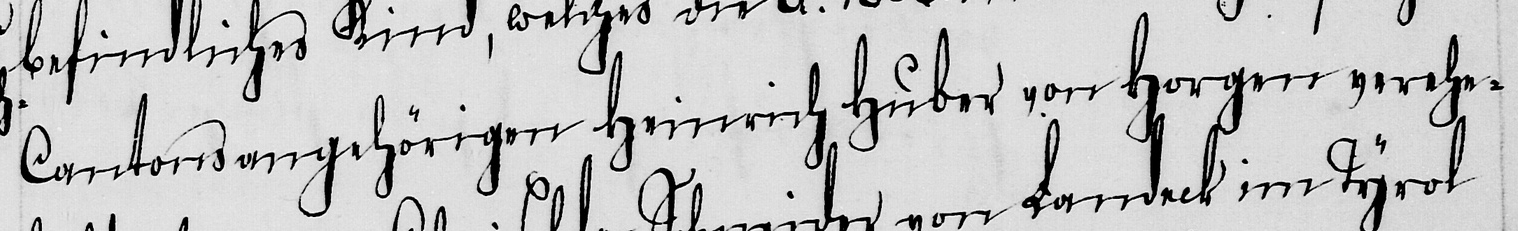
Cantonsangehörigen Heinrich Huber von Horgen verehe¬
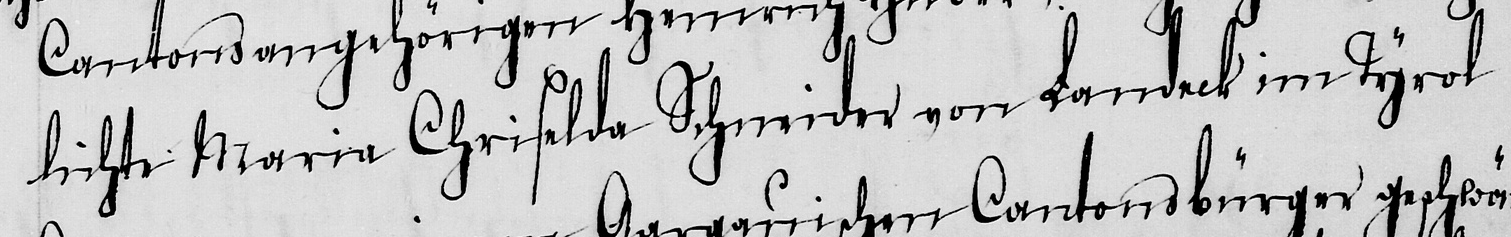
lichte Maria Chriselda Schneider von Landeck im Tyrol
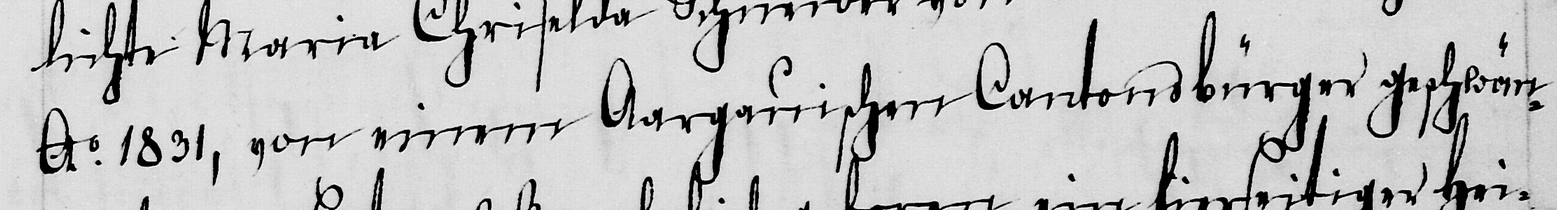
Ao. 1831, von einem Aargauischen Cantontsbürger geschwän¬
